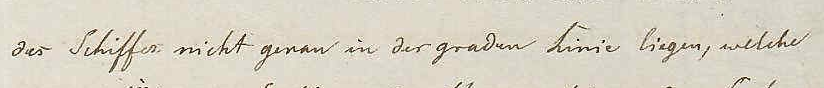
des Schiffes nicht genau in der graden Linie liegen, welche
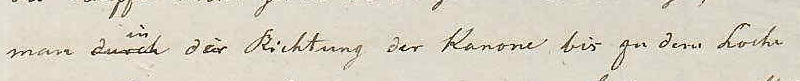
man durchin dieer Richtung der Kanone bis zu dem Loche
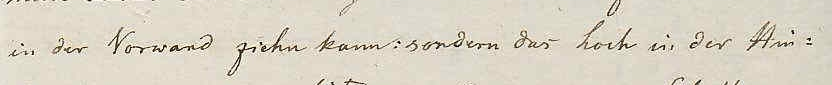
in der Vorwand ziehn kann: sondern das Loch in der Hin-
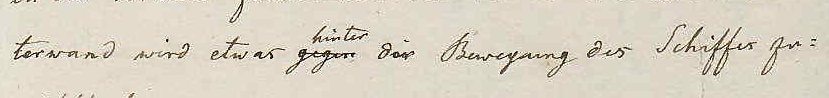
terwand wird etwas gegenhinter dieer Bewegung des Schiffes zu-
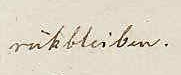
rükbleiben.
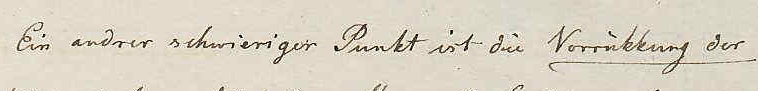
Ein andrer schwieriger Punkt ist die Vorrükkung der
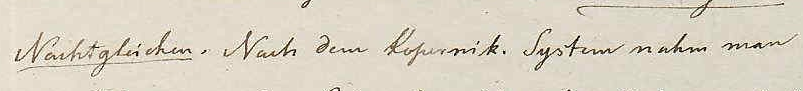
Nachtgleichen. Nach dem Kopernik. System nahm man
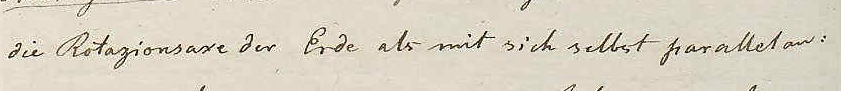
die Rotazionsaxe der Erde als mit sich selbst parallel an:
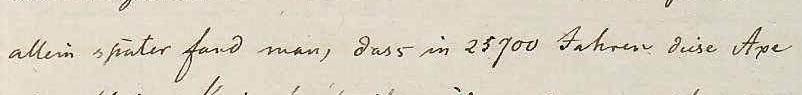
allein später fand man, dass in 25700 Jahren diese Axe
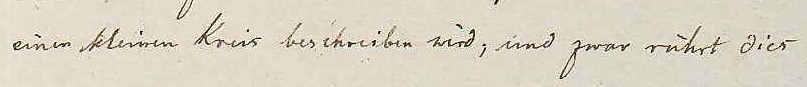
einen kleinen Kreis beschreiben wird, und zwar rührt dies
